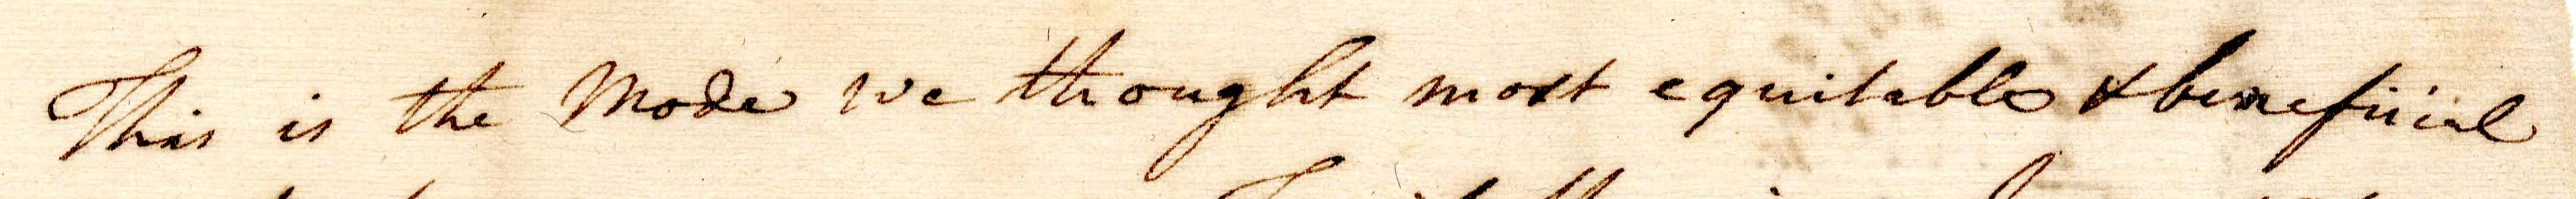This is the mode we thought most equitable & beneficial
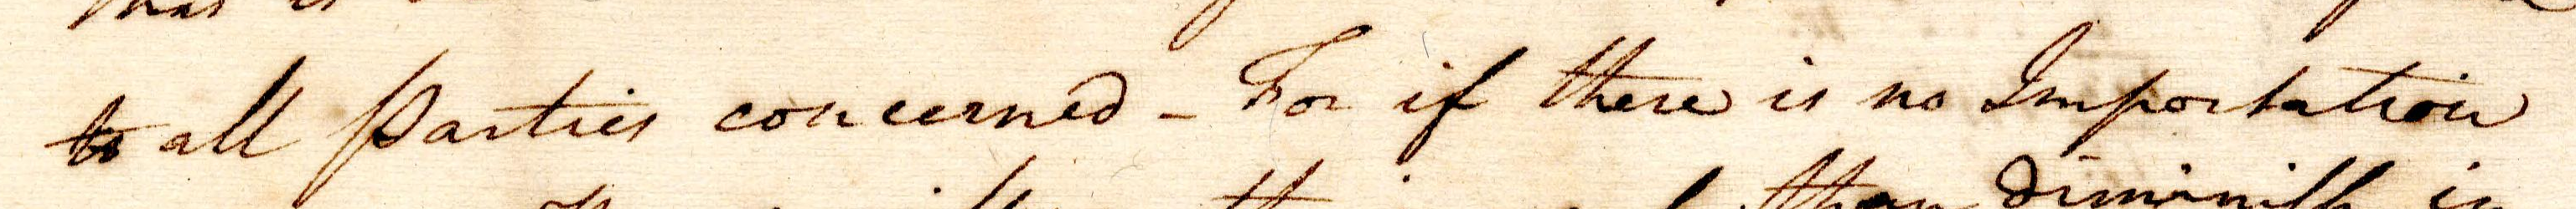to all parties concerned- For if there is no Importation
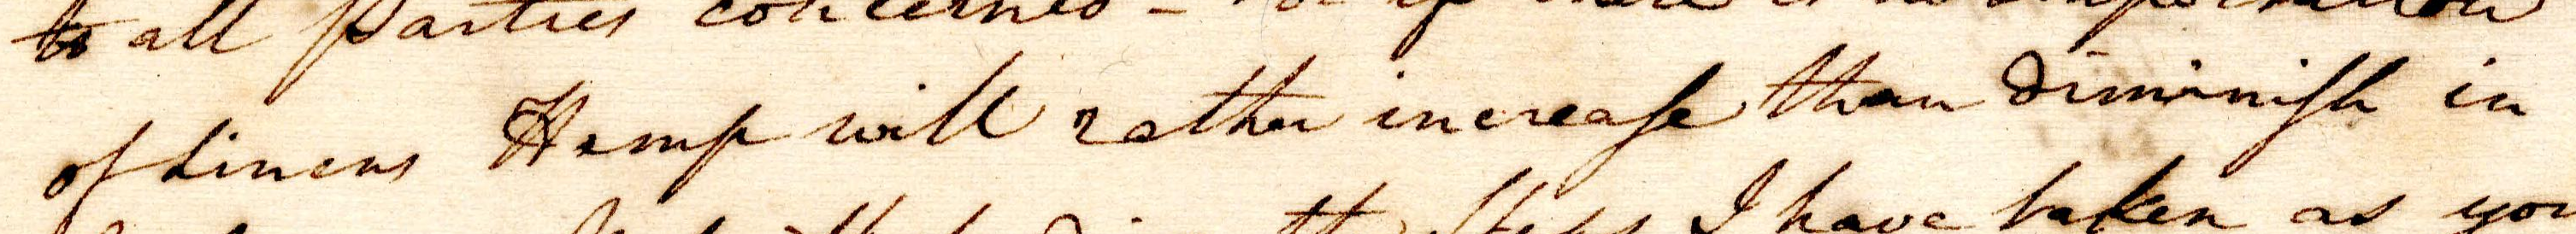of Linens Hemp will rather increase than diminish in
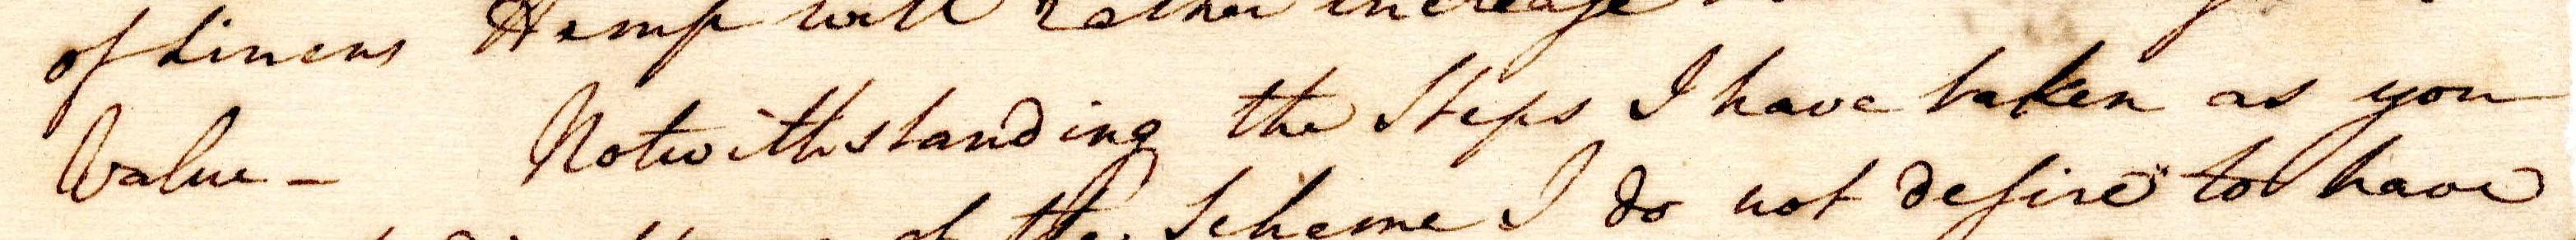Value- Notwithstanding the Steps I have taken as you
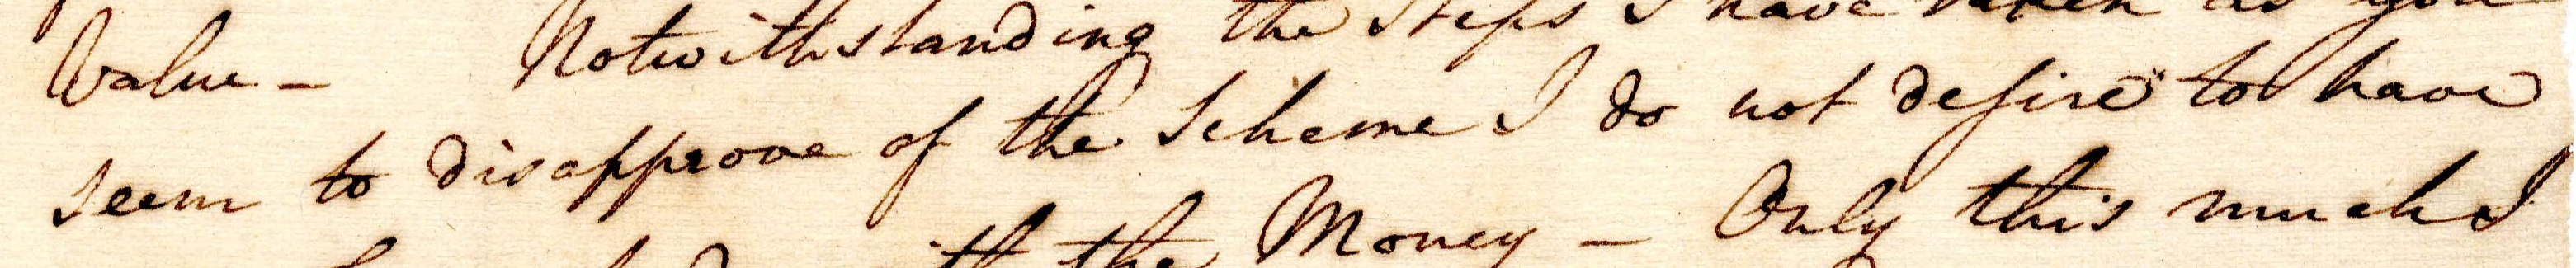seem to disapprove of the Scheme I do not desire to have
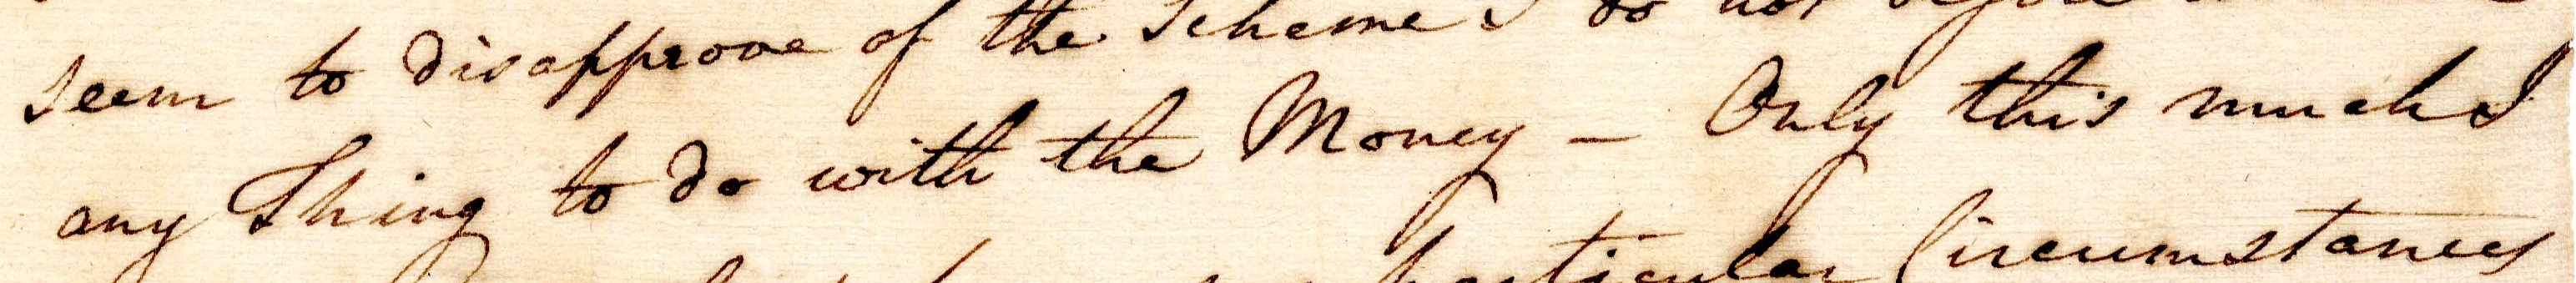any Thing to do with the Money- Only this much I
